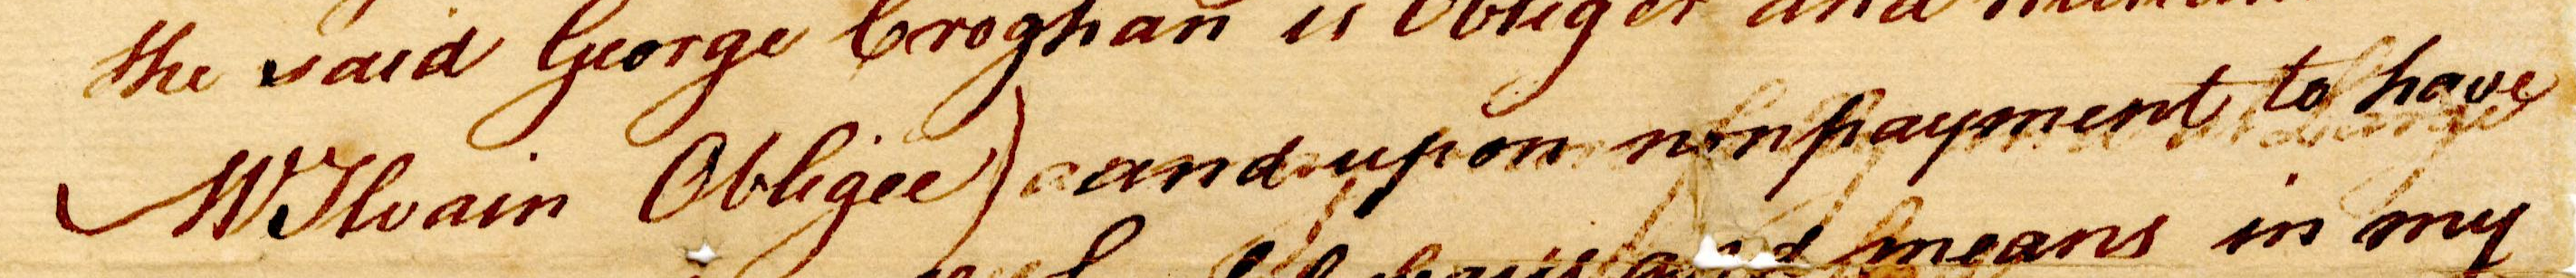Wjlvain Obligee) and upon nonpayment to have
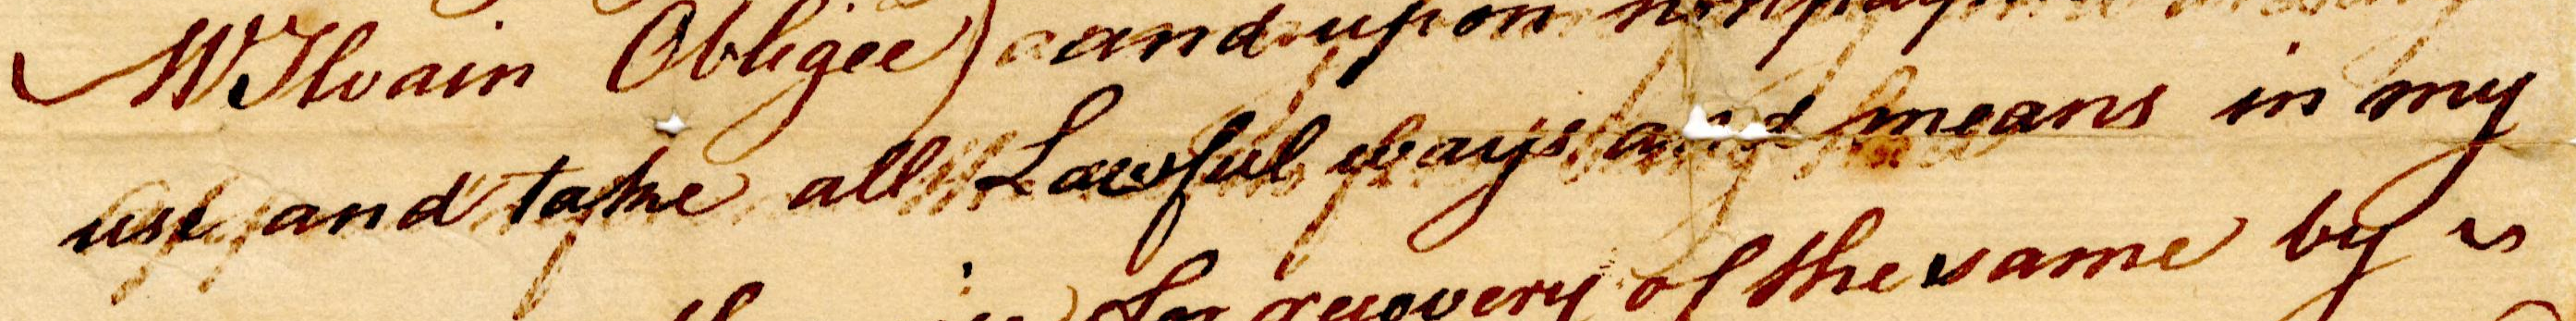use and take all Lawful ways and means in my
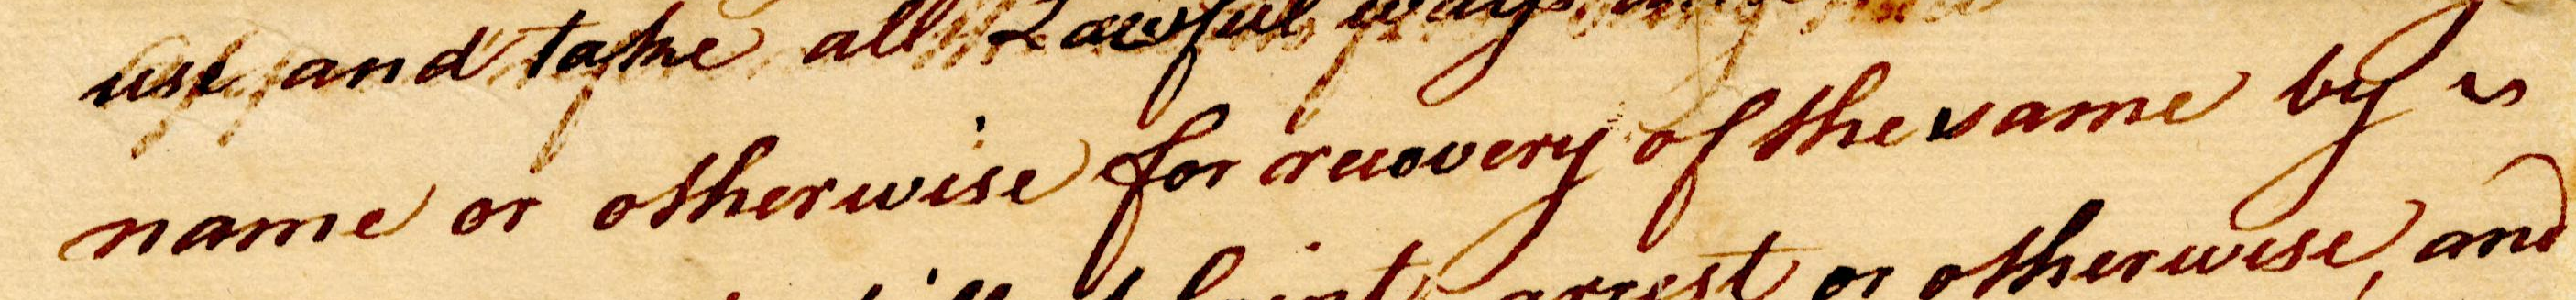name or otherwise for recovery of the same by-
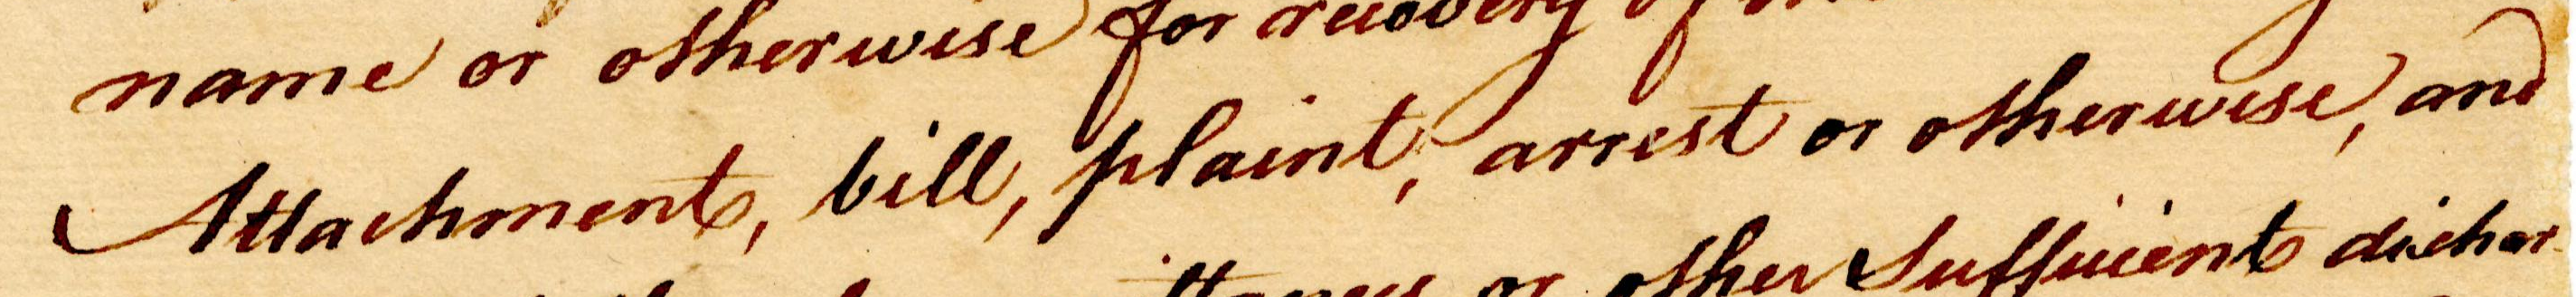Attachment, bill, plaint arrest or otherwise, and
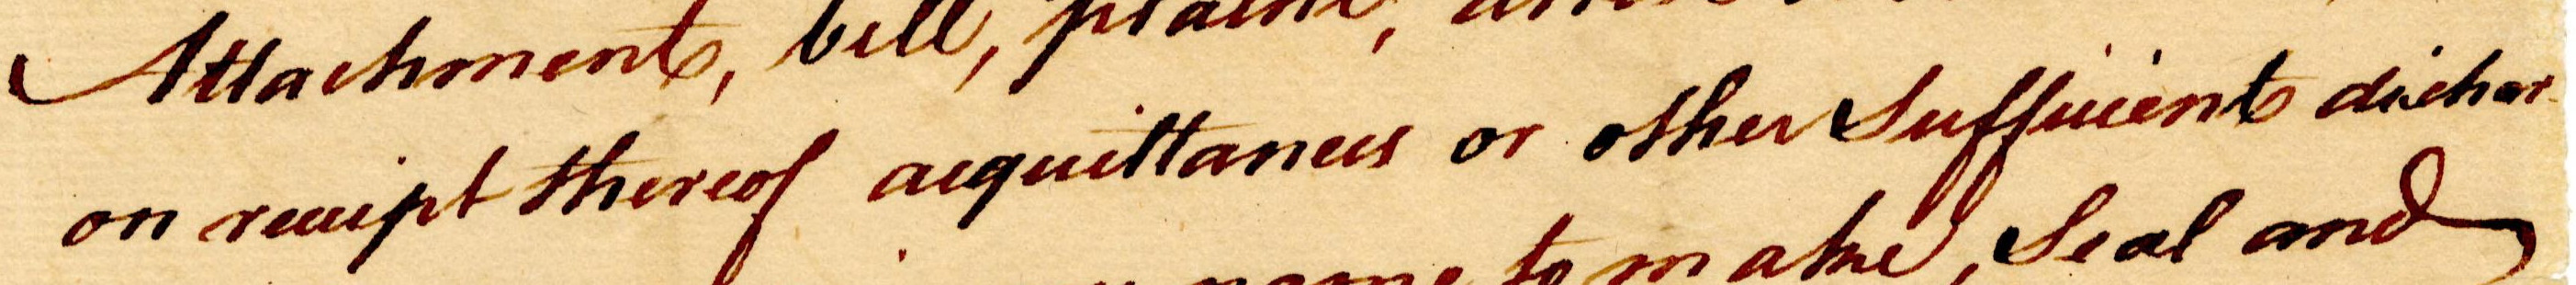on receipt thereof acquittances or other Sufficient dricher-
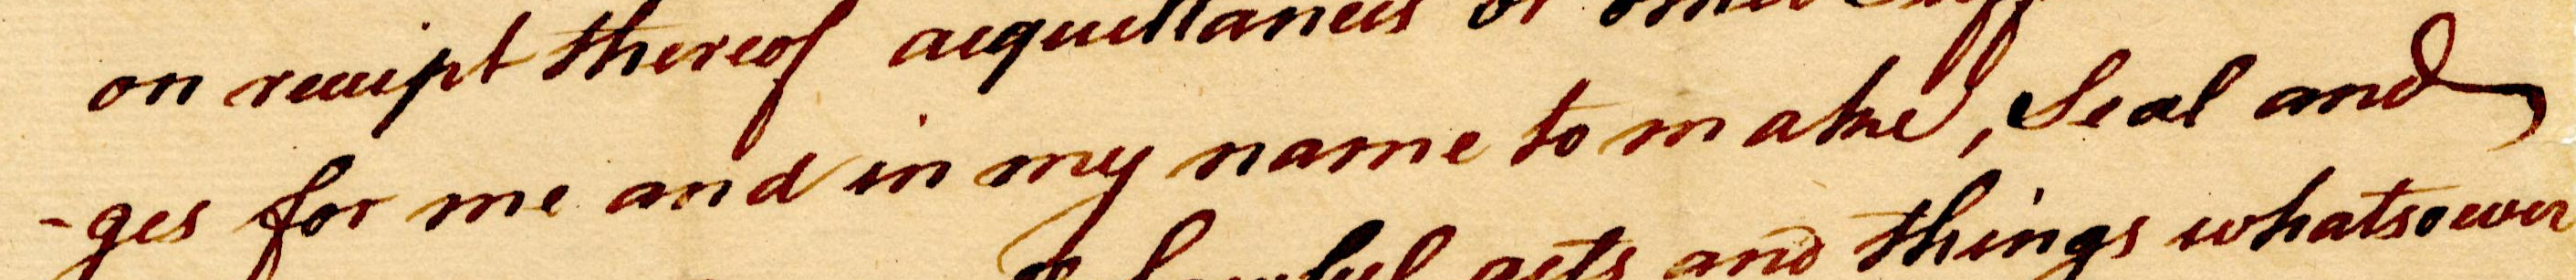-ges for me and in my name to make, Seal and
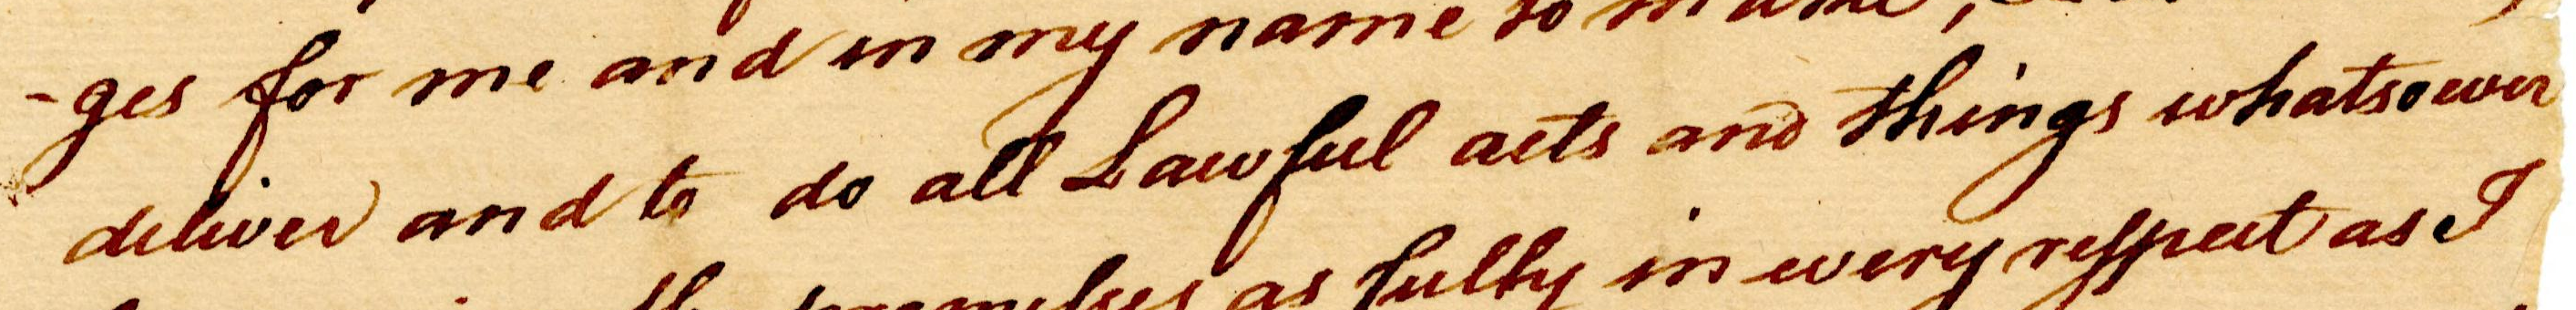deliver and to do all Lawful acts and things whatsoever
